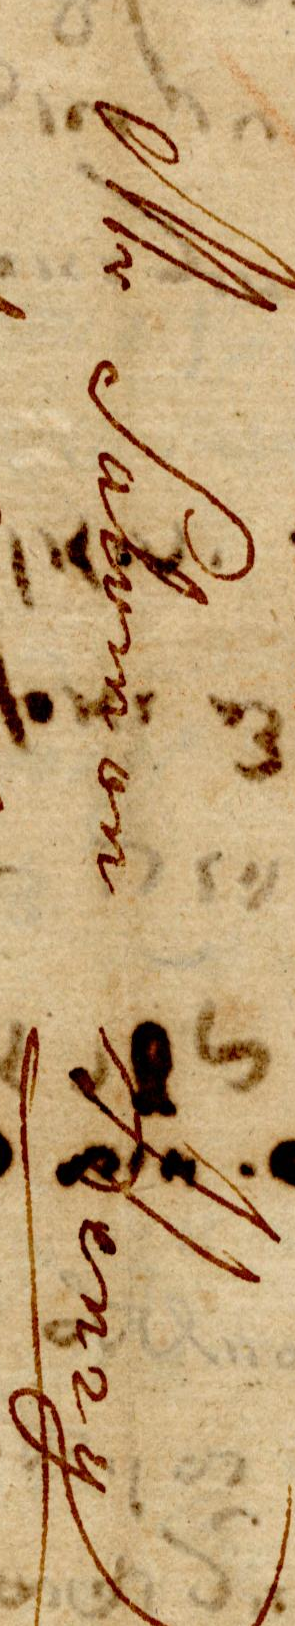Mr Salomon Henry
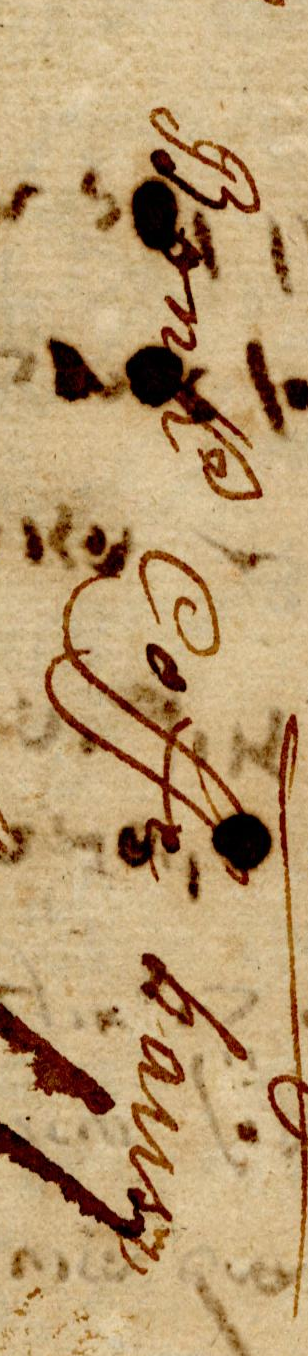Bank coffe haus
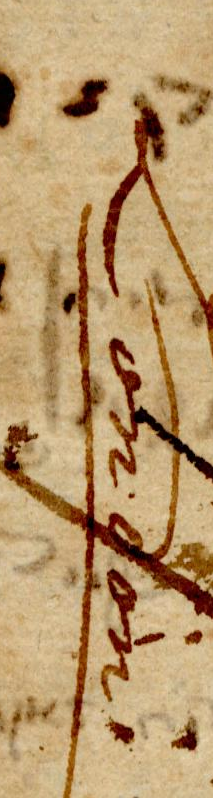London
